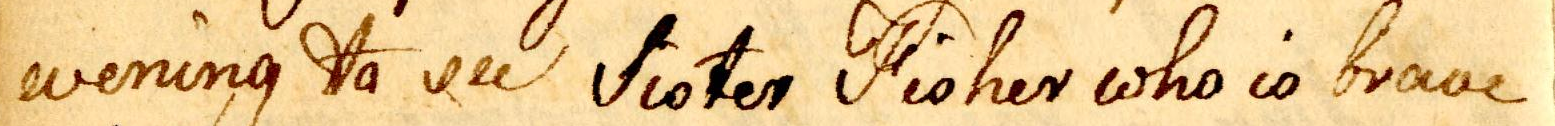evening to see Sister Fisher who is brave
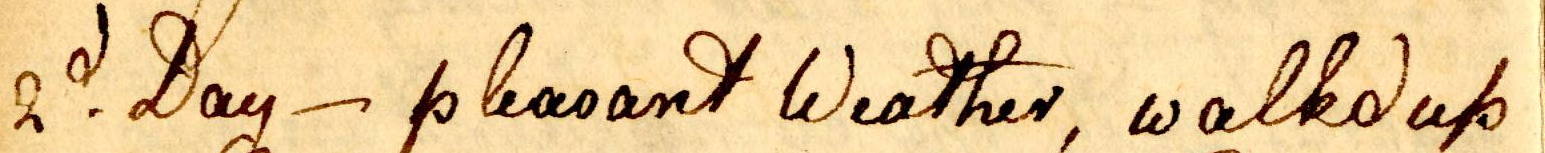2^d. Day- pleasant Weather, walkd up
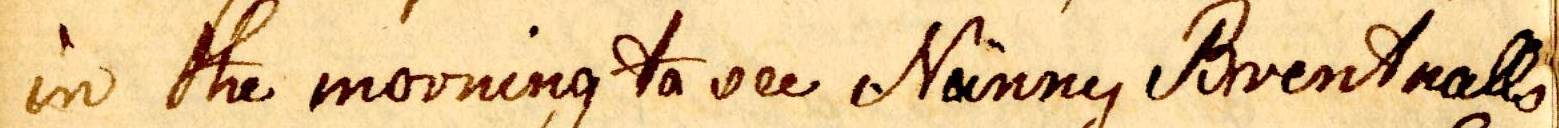in the morning to see Nanny Brentnalls
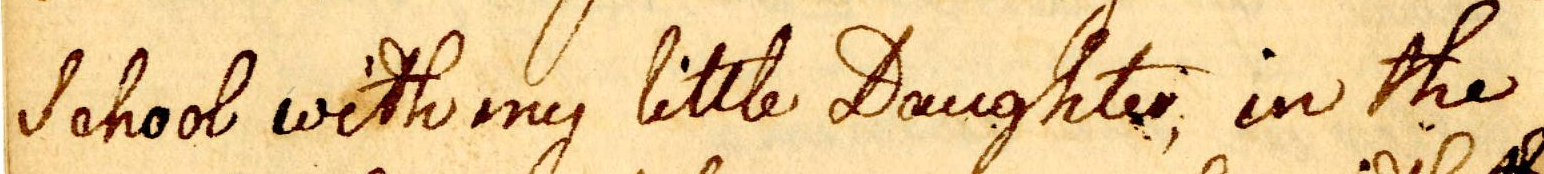School with my little Daughter, in the
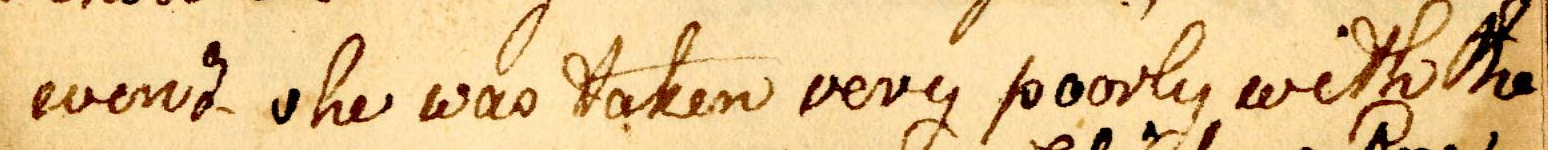even^g she was taken very poorly with the
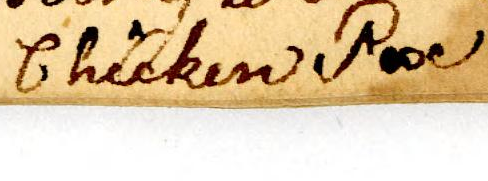Chicken Pox
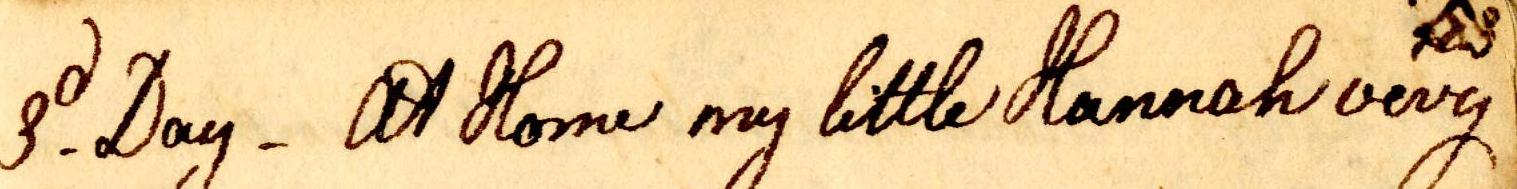3^d Day- At Home my little Hannah very
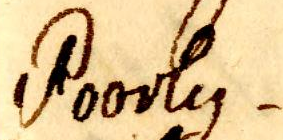Poorly
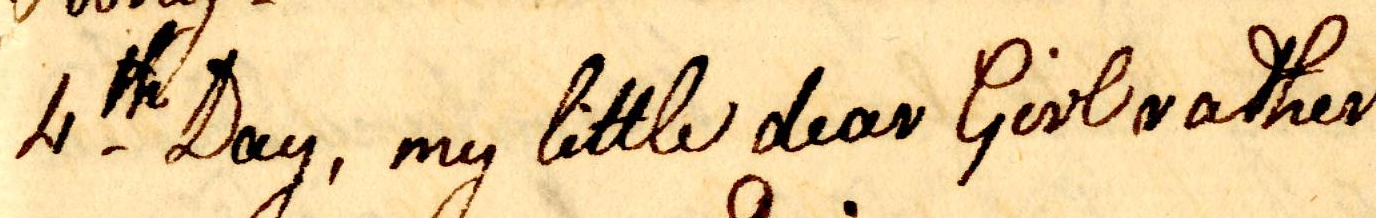4^th Day, my little dear Girl rather
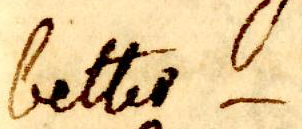better
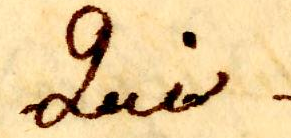Qui
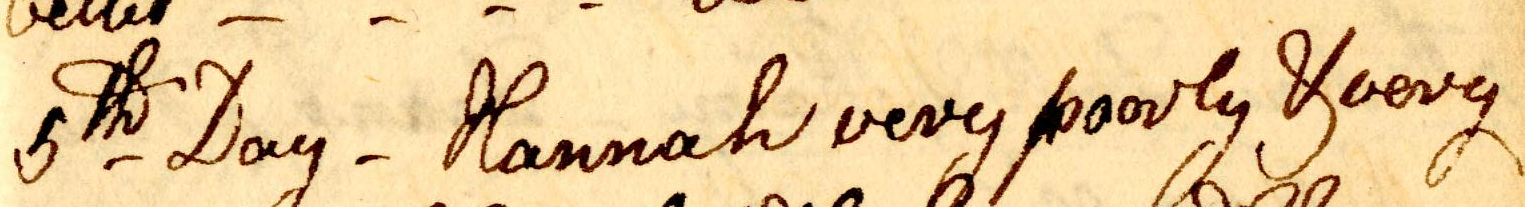5^th Day- Hannah very poorly & very
